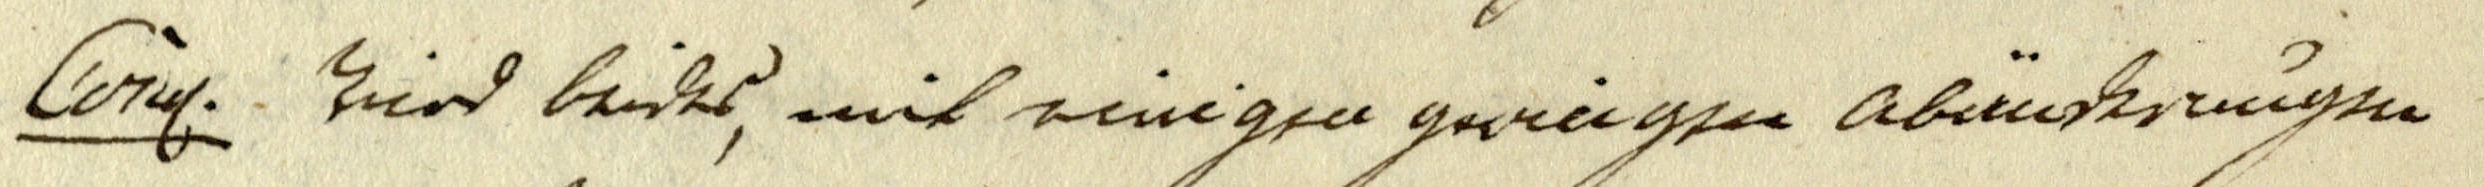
Concl. Wird beides, mit einigen geringen Abänderungen
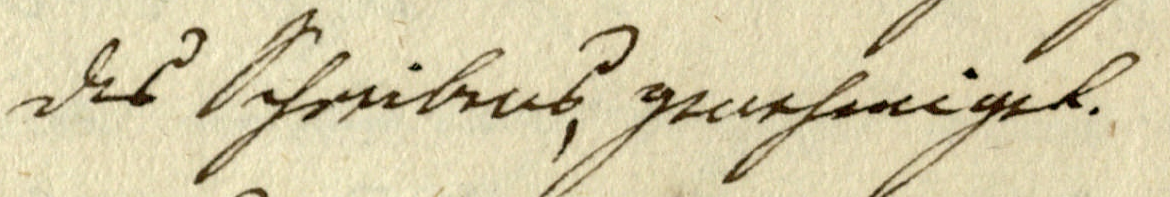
des Schreibens, genehmiget.
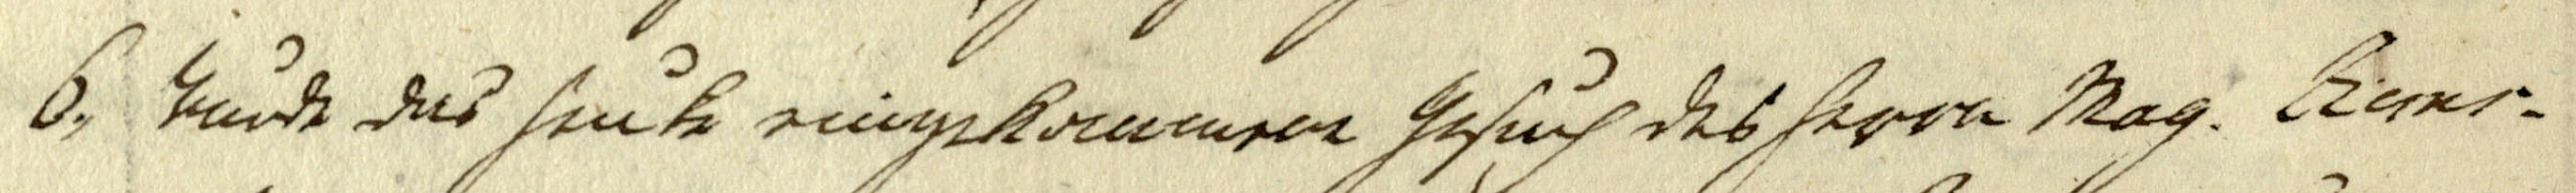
6. Wurde das heute eingekommene Gesuch des herrn Mag. Ziems¬
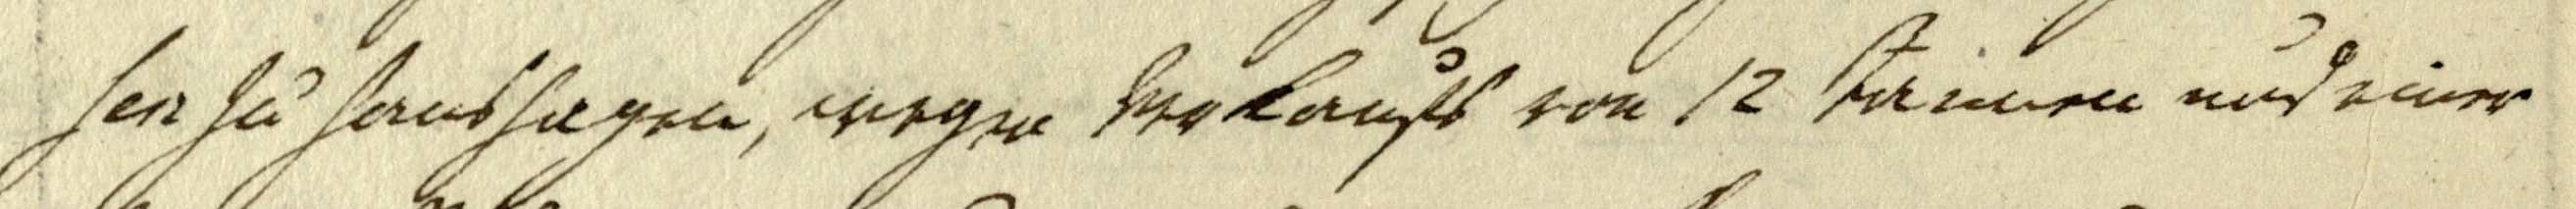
sen zu hanshagen, wegen Verkaufs von 12 Tannen und einer
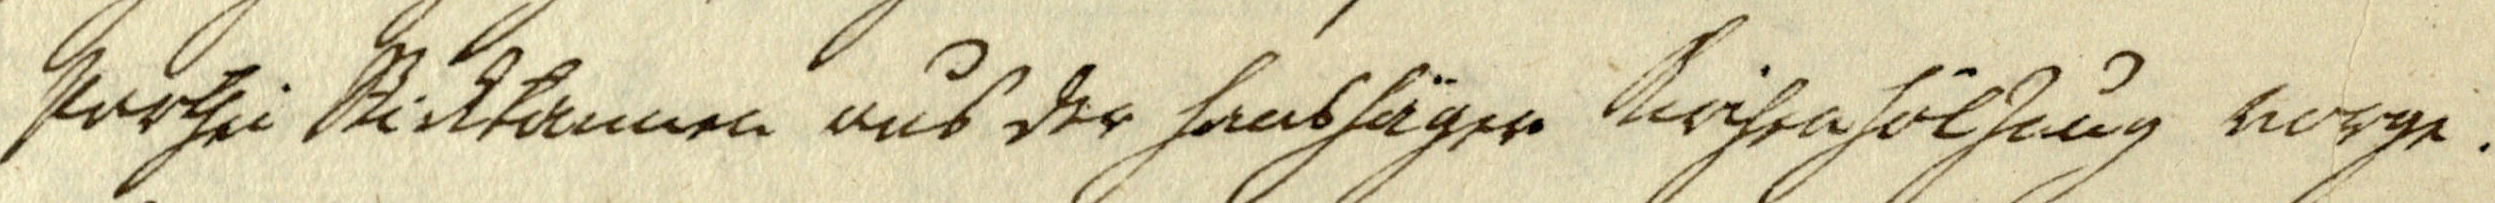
Parthei Sticktannen aus der hanshäger Kirchenhölzung vorge¬
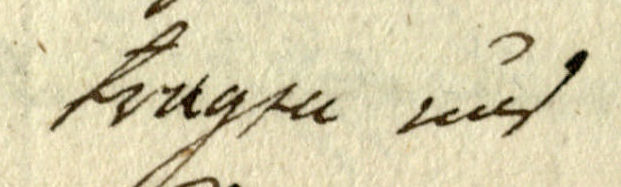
tragen und
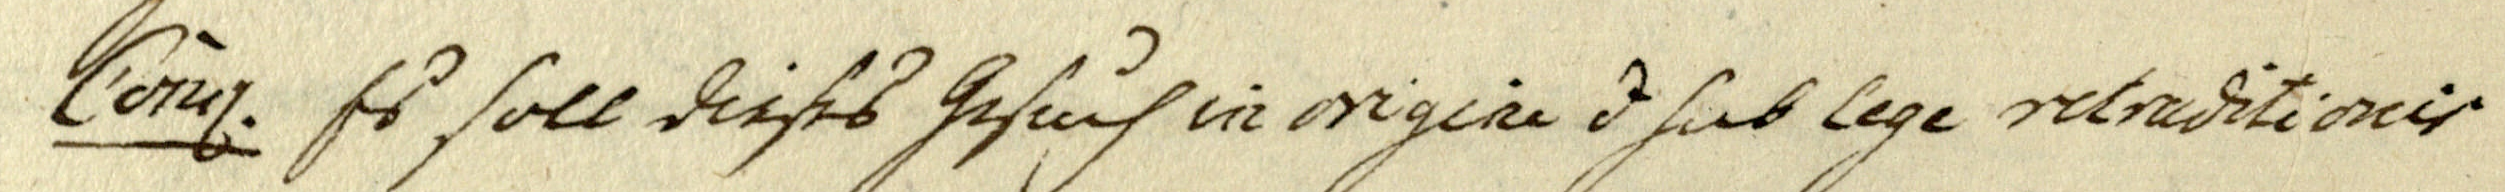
Concl. Es soll dieses Gesuch im origine et sub lege retraditionis
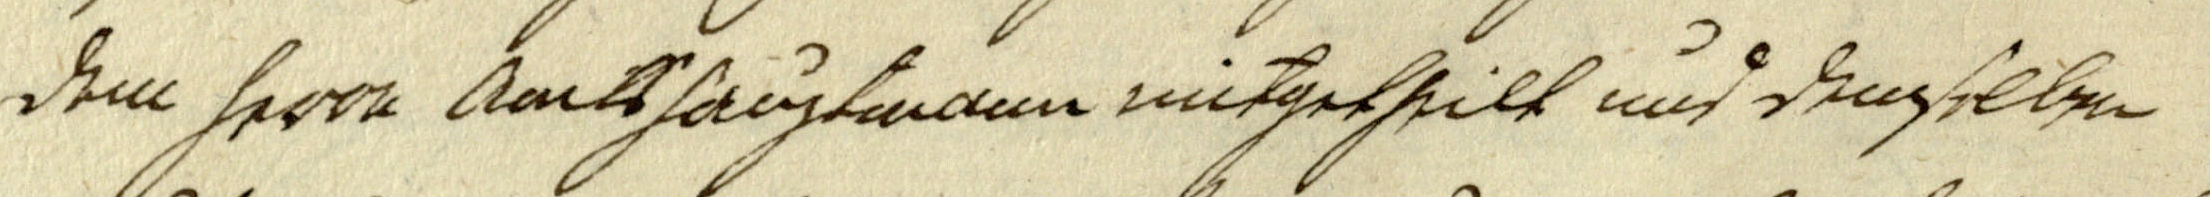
dem herrn Amtshauptmann mitgetheilt und demselben
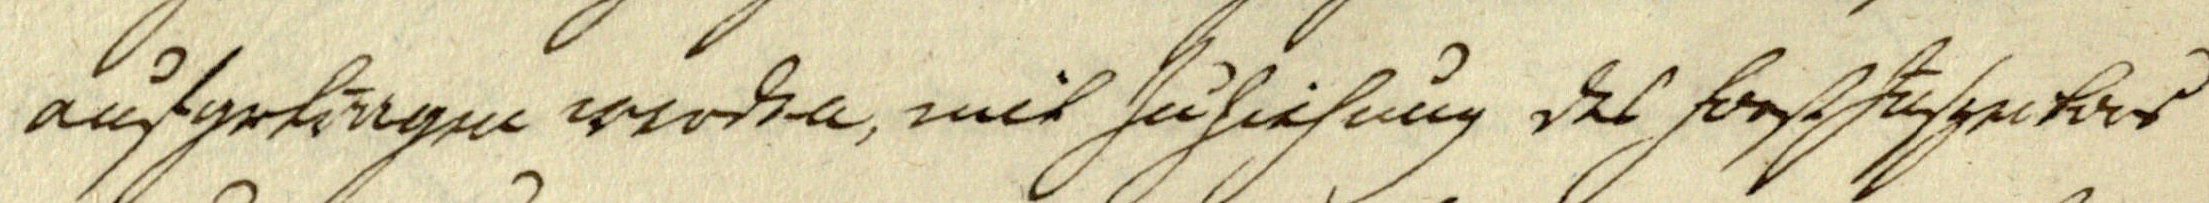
aufgetragen werden, mit Zuziehung des ForstInspecktors
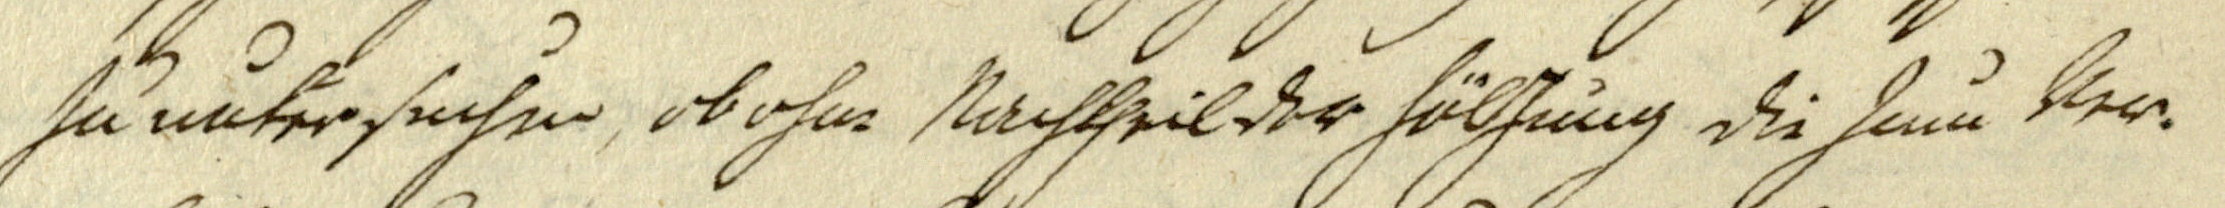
zu untersuchen, ob ohne Nachtheil der Hölzung die zum Ver¬
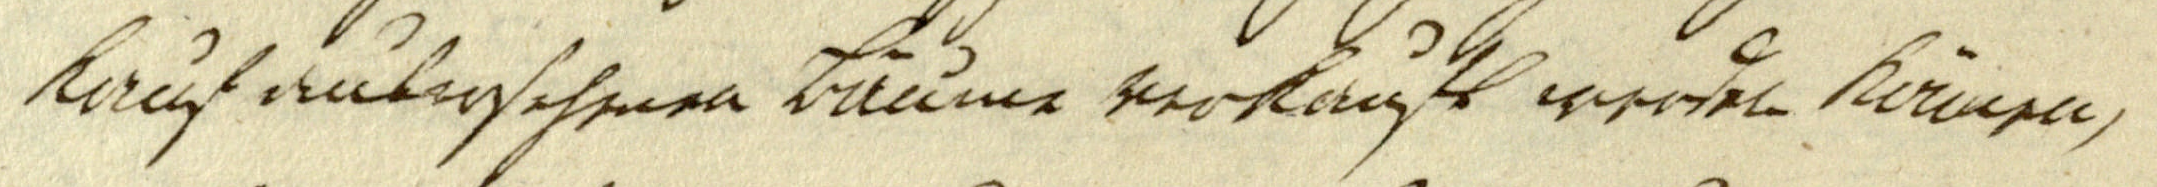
kauf ausersehenen Bäume verkauft werden können,
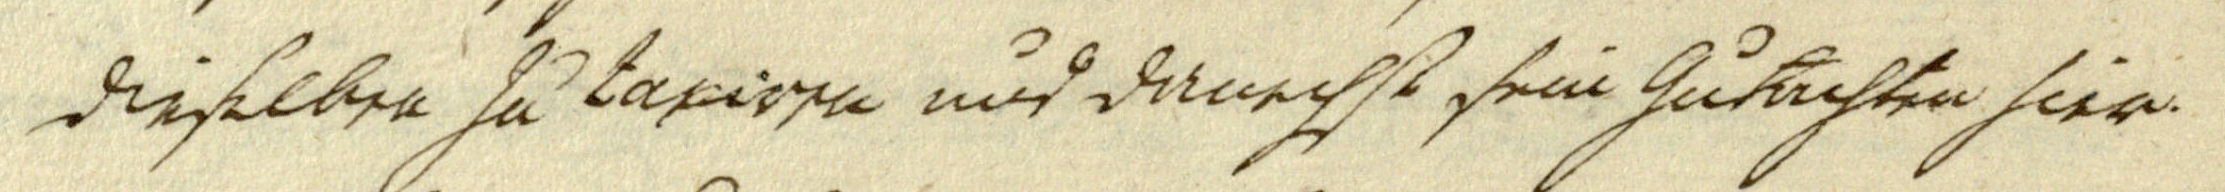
dieselben zu taxiren und danechst sein Gutachten hier¬
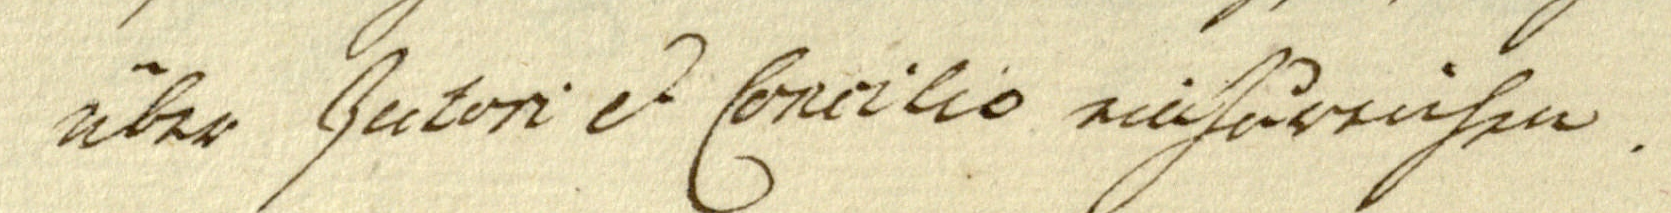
über Rectori et Concilio einzureichen.
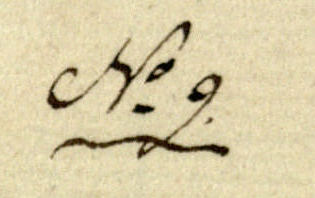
Nº 9.
